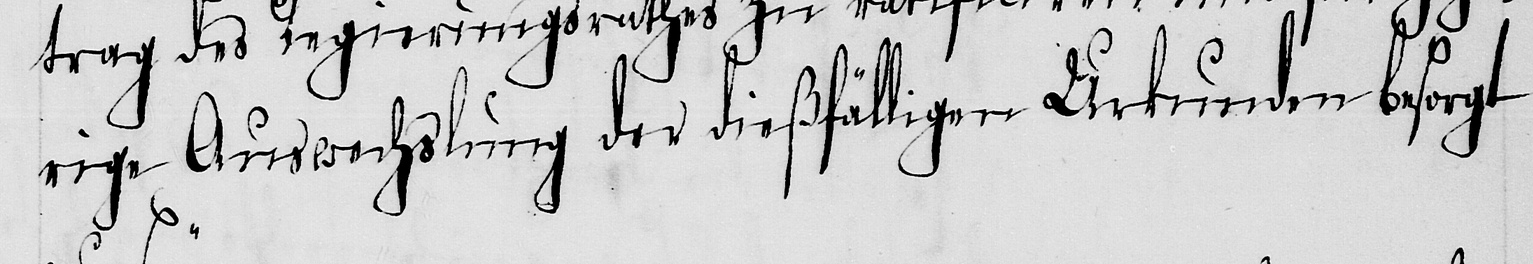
rige Auswechslung der dießfälligen Urkunden besorgt
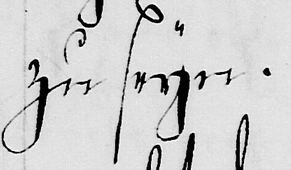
zu seyn.
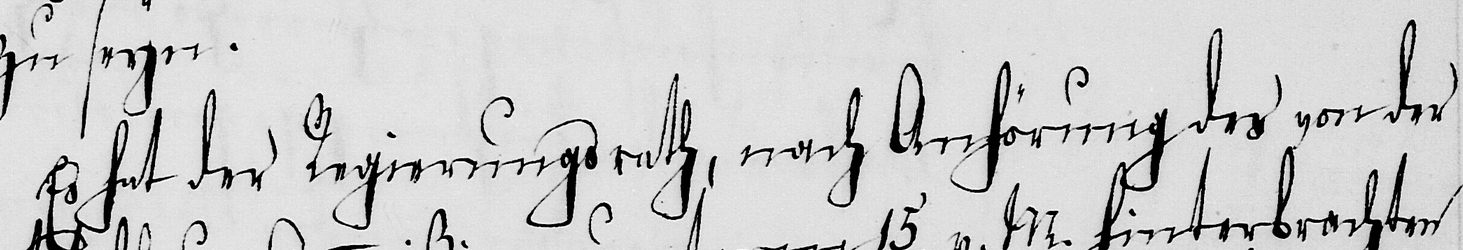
hat der Regierungsrath, nach Anhörung des von der
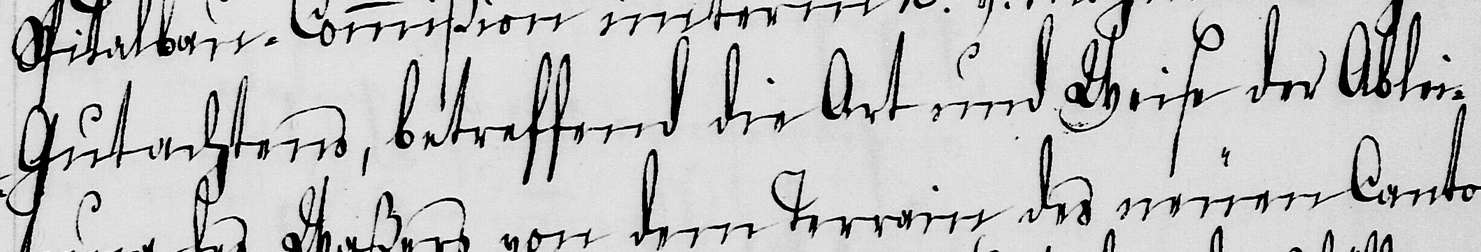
Gutachtens, betreffend die Art und Weise der Ablei¬
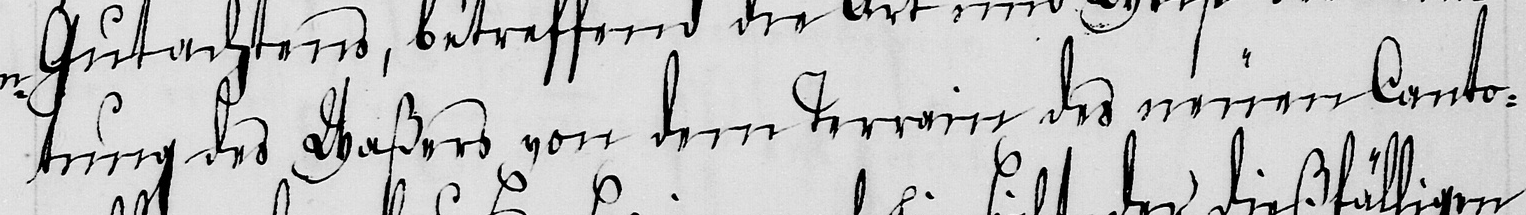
tung des Waßers von dem Terrain des neuen Canto¬
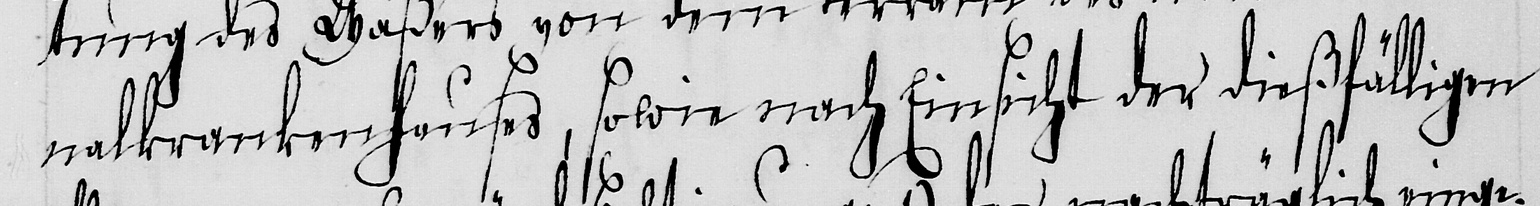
nalkrankenhauses, sowie nach Einsicht der dießfälligen
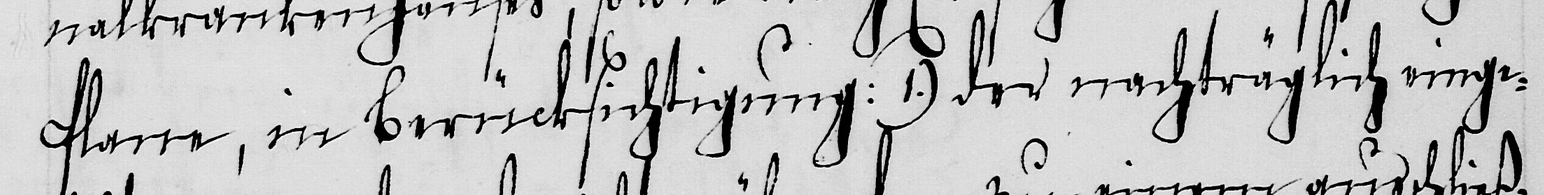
Plane, in Berücksichtigung: 1.) der nachträglich einge¬
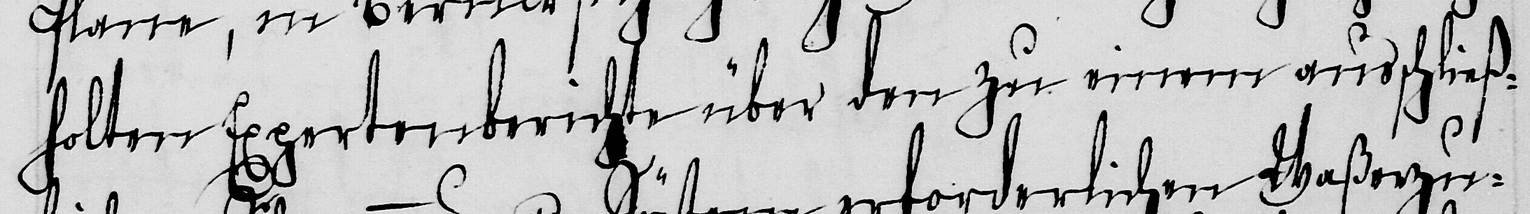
holten Expertenberichte über den zu einem ausschließ¬
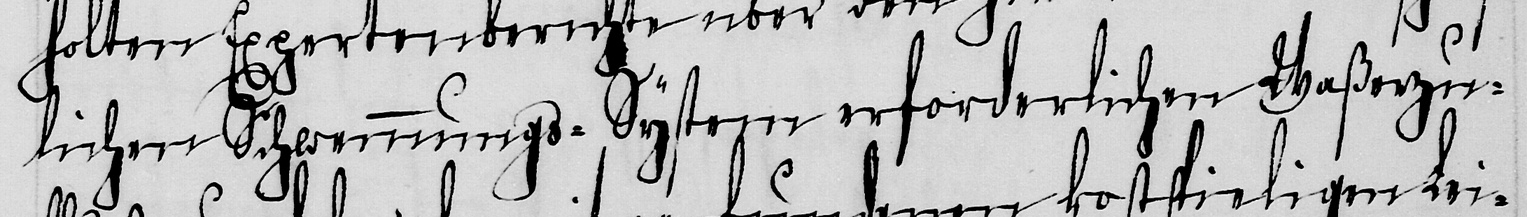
lichen Schwemmungs-System erforderlichen Waßerzu¬
